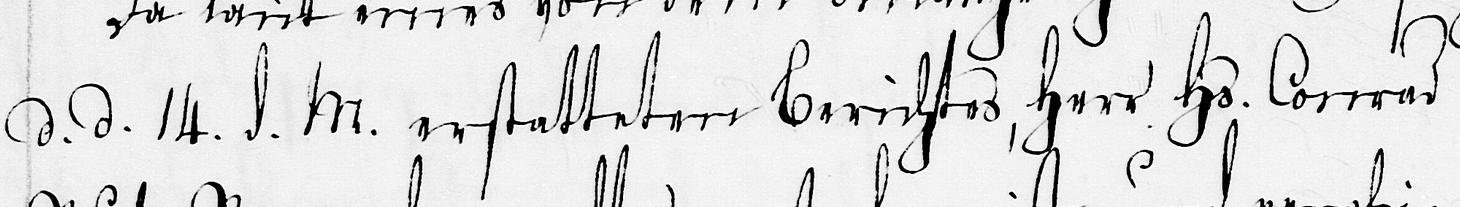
d. d. 14. d. M. erstatteten Berichtes, Herr Hs. Conrad
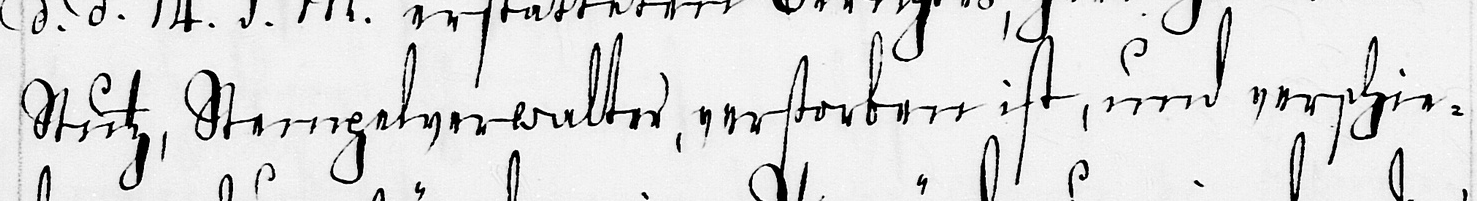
Stutz, Stempelverwalter, verstorben ist, und verschie¬
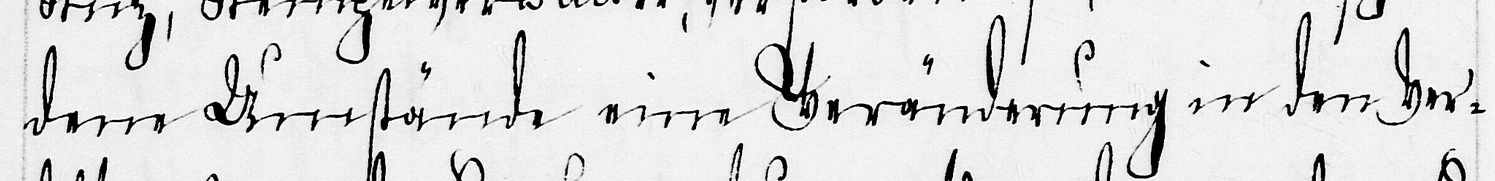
dene Umstände eine Veränderung in den Ver¬
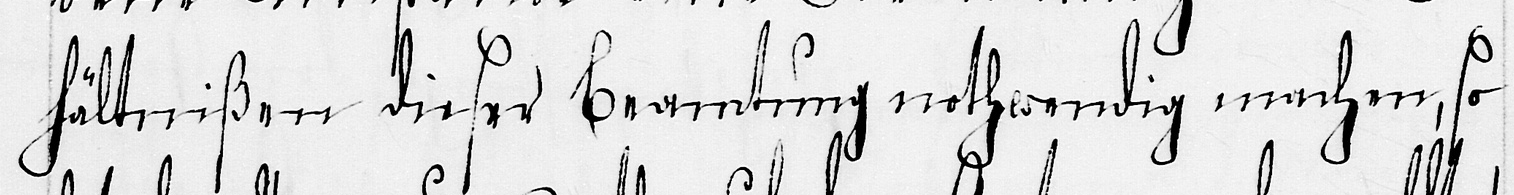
hältnißen dieser Beamtung nothwendig machen, so
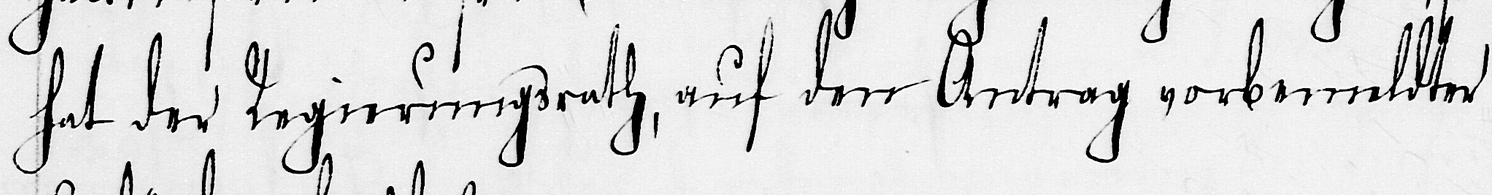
hat der Regierungsrath, auf den Antrag vorbemeldter
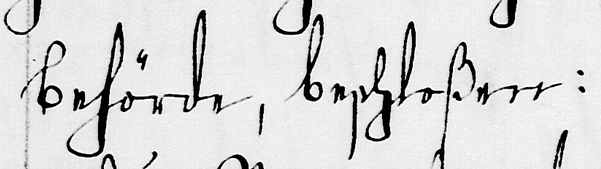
Behörde, beschloßen:
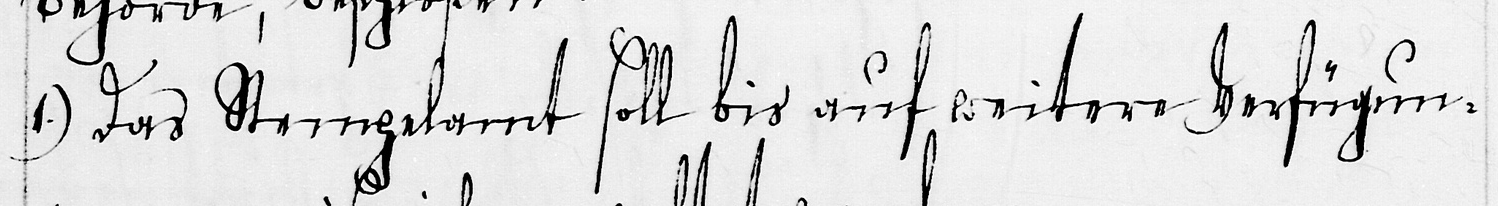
1.) Das Stempelamt soll bis auf weitere Verfügun¬
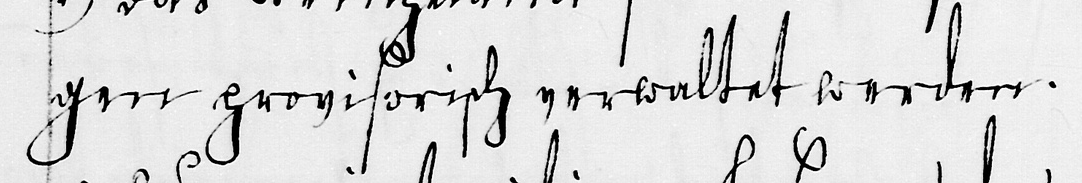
gen provisorisch verwaltet werden.
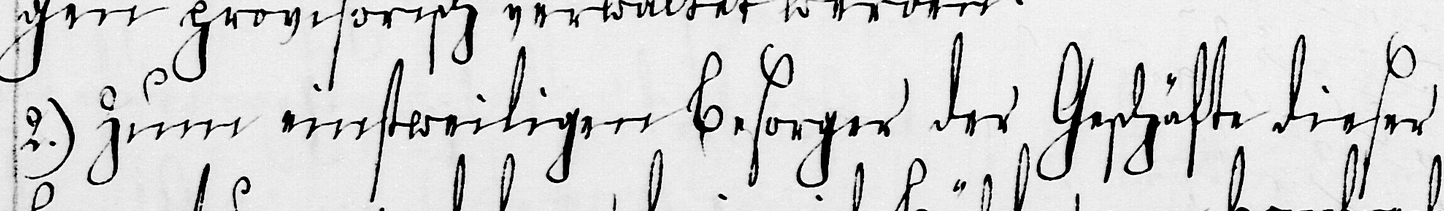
2.) Zum einstweiligen Besorger der Geschäfte dieser
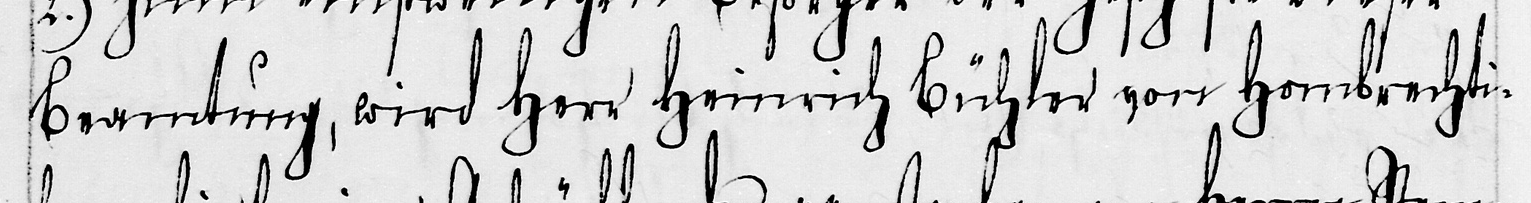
Beamtung, wird Herr Heinrich Bühler von Hombrechti¬
